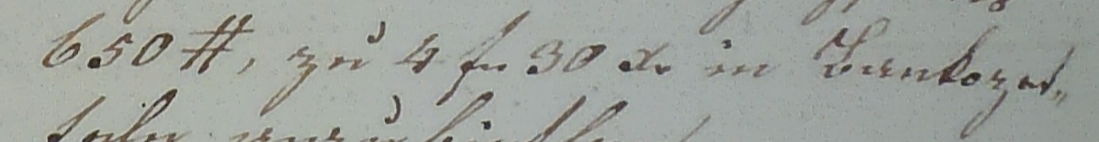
650 #, zu 4 fn 30 xr in Bankozet¬
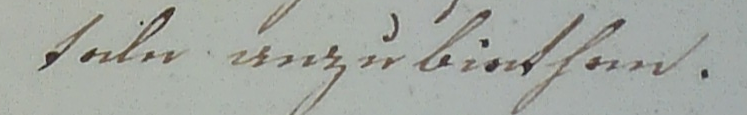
teln anzubiethen.
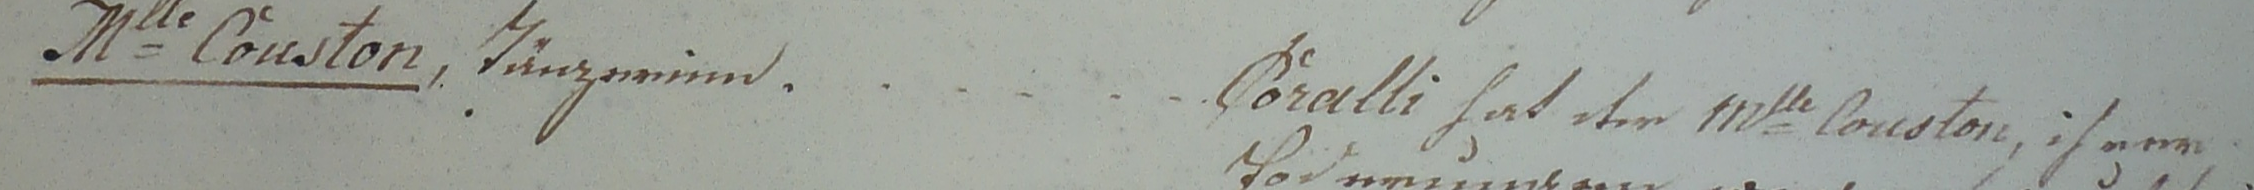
Mll͇e Couston, Tänzerinn ……. Coralli hat der Mll͇e Couston, ihrer
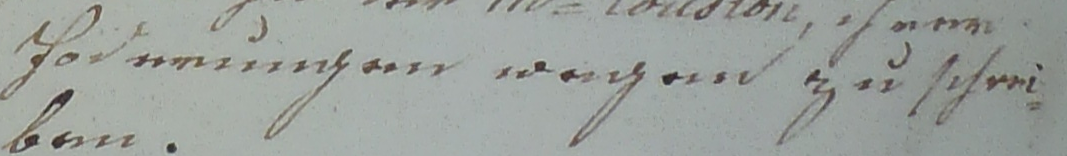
Foderungen wegen zu schrei¬
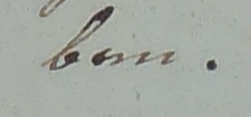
ben.
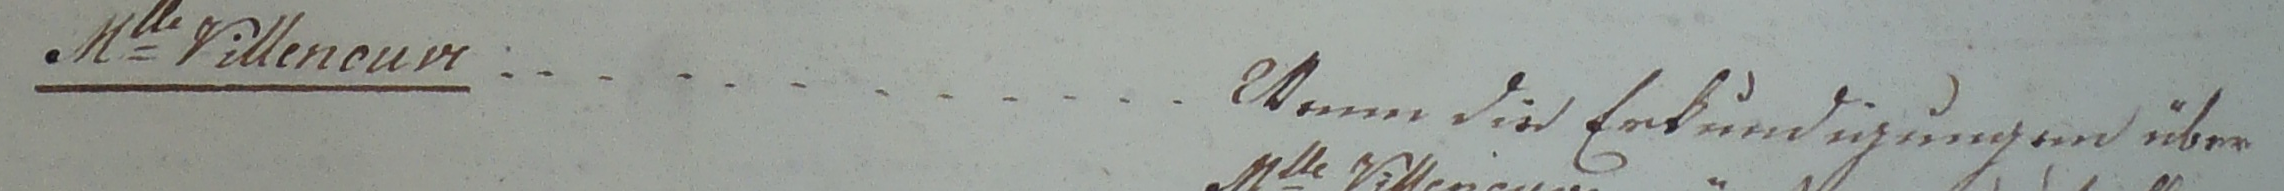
Mll͇e Villeneuve ……….. Wenn die Erkundigungen übergeben
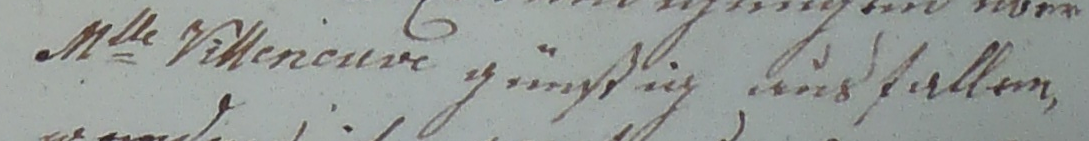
Mll͇e Villeneuve günstig ausfallen,
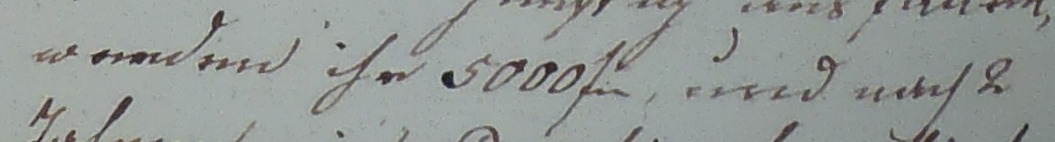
werden ihr 5000fn, und nach 2
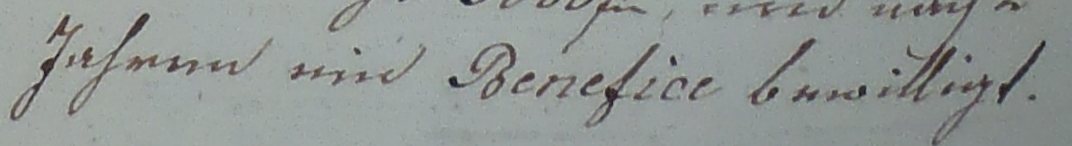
Jahren ein Benefice bewilligt.
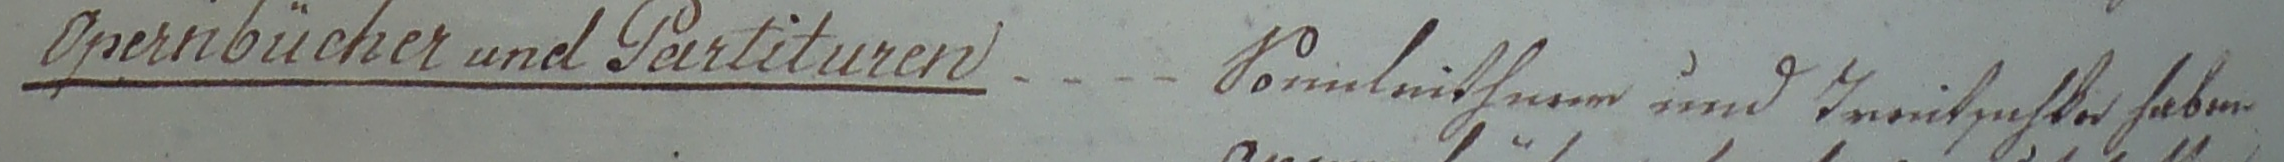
Opernbücher und Partituren …. Sonnleithner und Treitschke haben
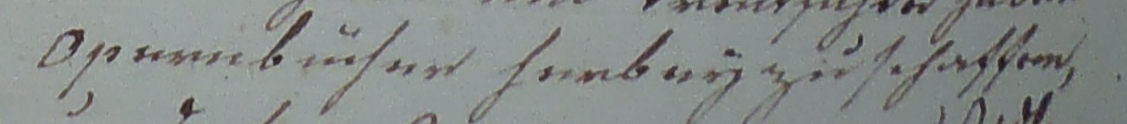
Opernbücher herbeyzuschaffen,
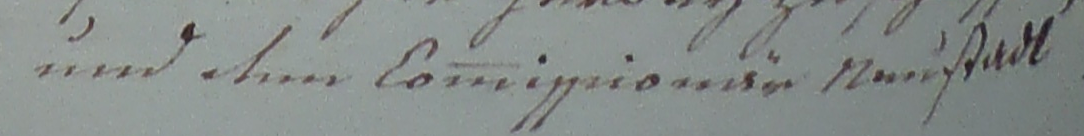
und dem Comissionär Neustadt
